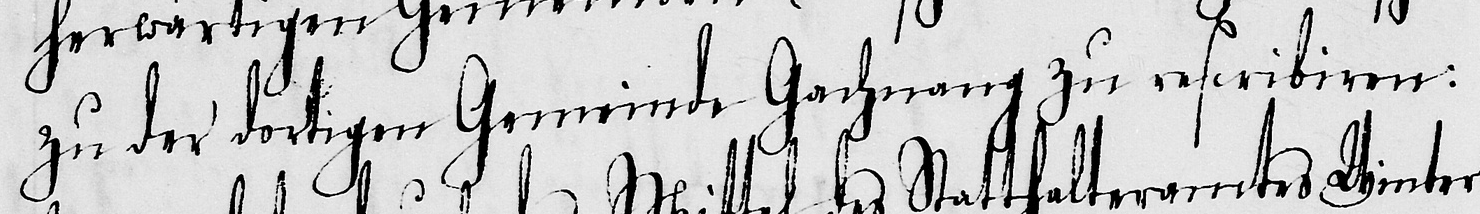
zu der dortigen Gemeinde Gachnang zu rescribiren:
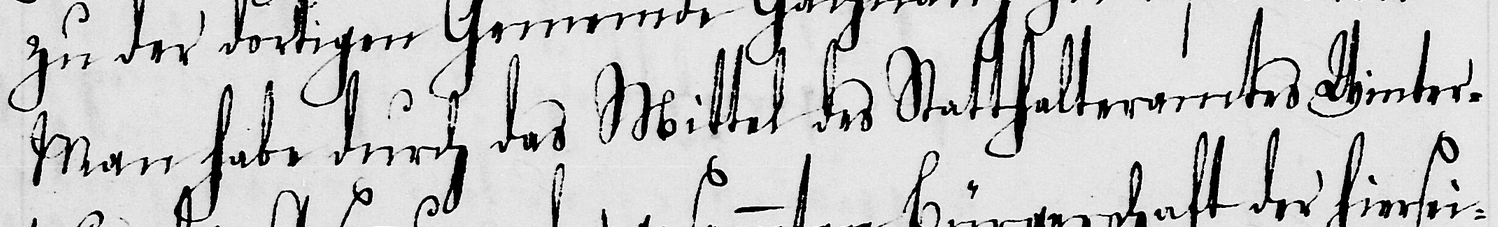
Man habe durch das Mittel des Statthalteramtes Winter¬
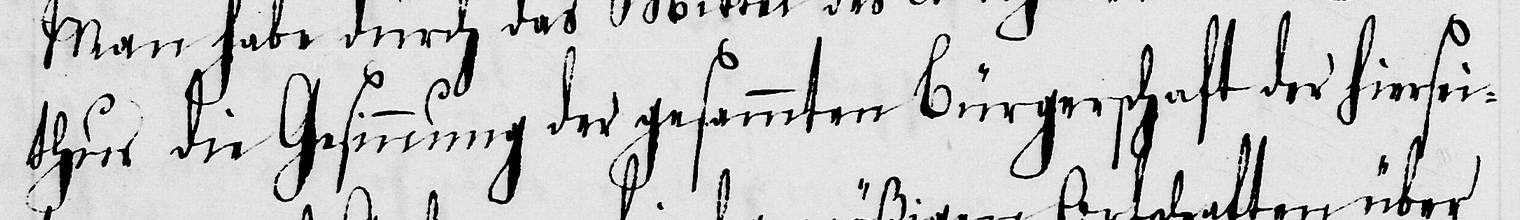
thur die Gesinnung der gesammten Bürgerschaft der hierse¬
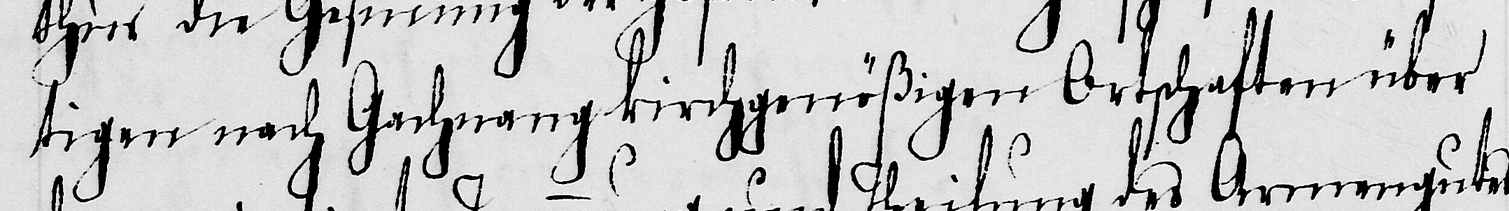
itigen nach Gachnang kirchgenößigen Ortschaften über
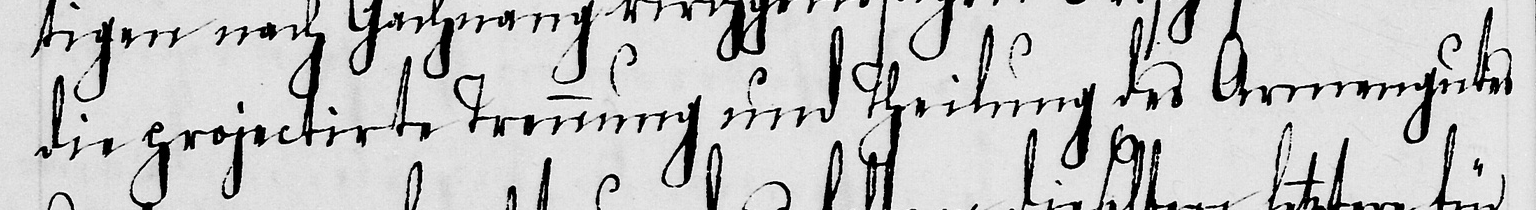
die projectirte Trennung und Theilung des Armengutes
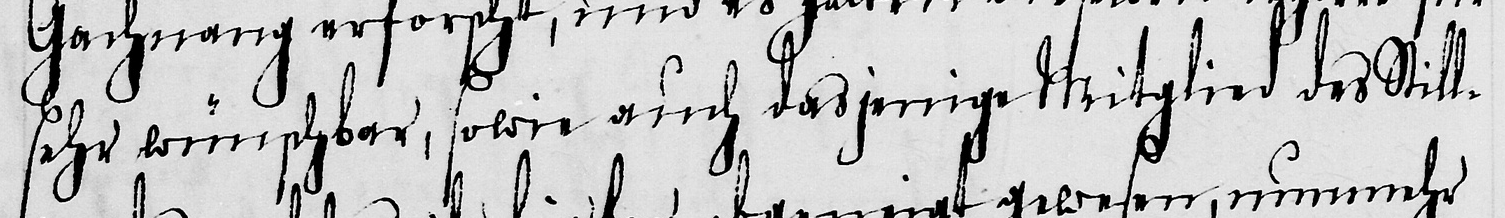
sehr wünschbar, sowie auch dasjenige Mitglied des Still¬
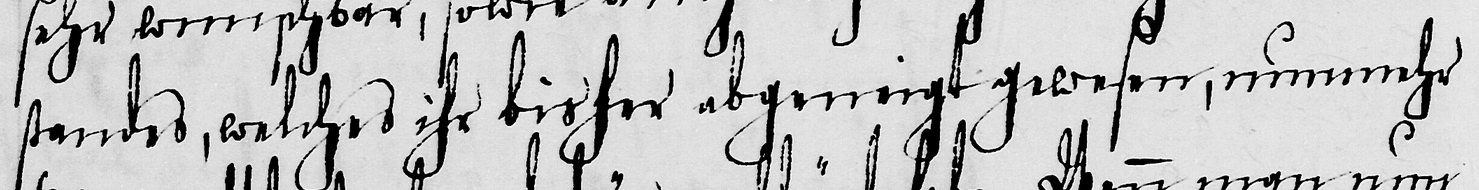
standes, welches ihr bisher abgeneigt gewesen, nunmehr
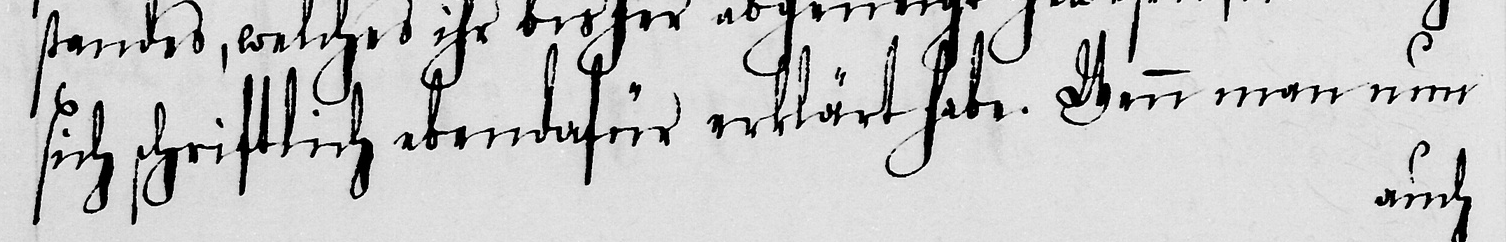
schriftlich ebendafür erklärt habe. Wenn man nun
